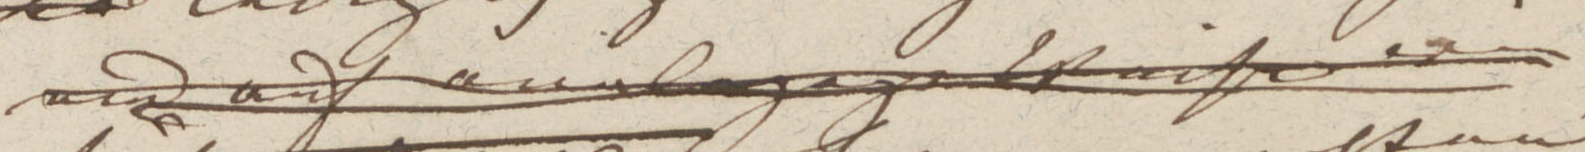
und auf analoge Weise wie
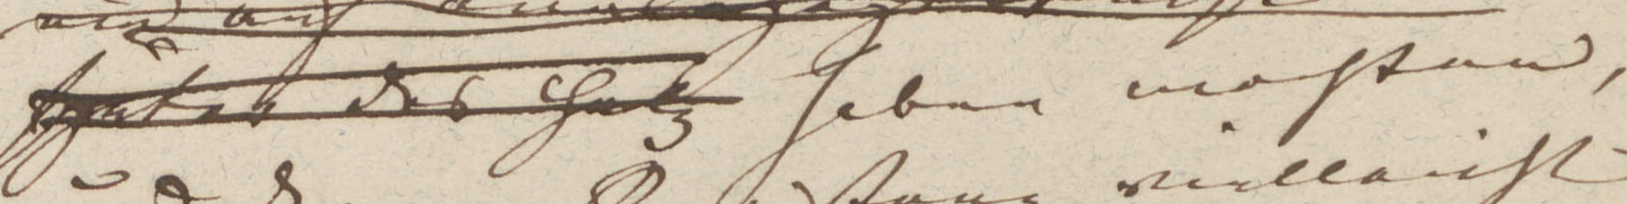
später das Holz haben mochten,
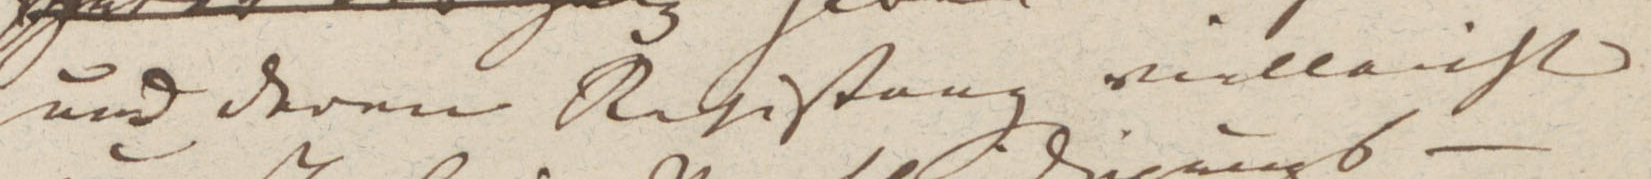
und deren Resistenz vielleicht
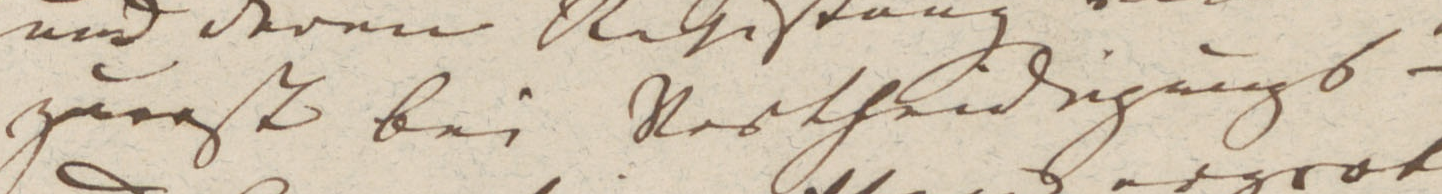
zuerst bei Vertheidigungs-
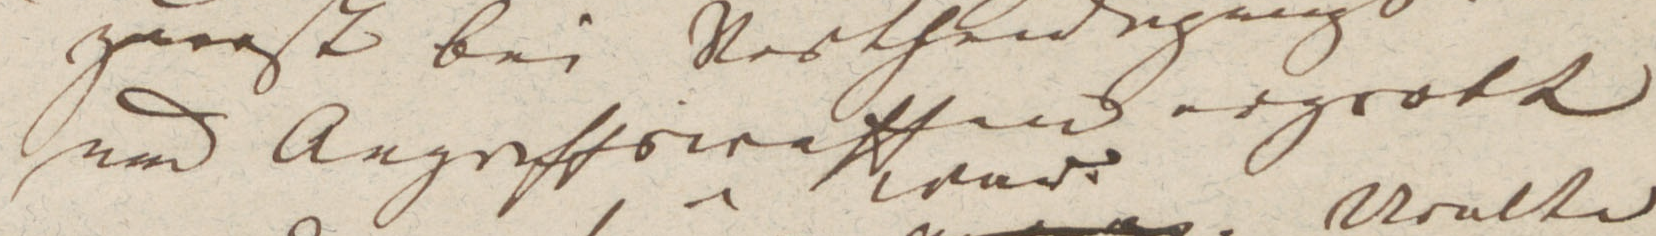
und Angriffswaffen erprobt
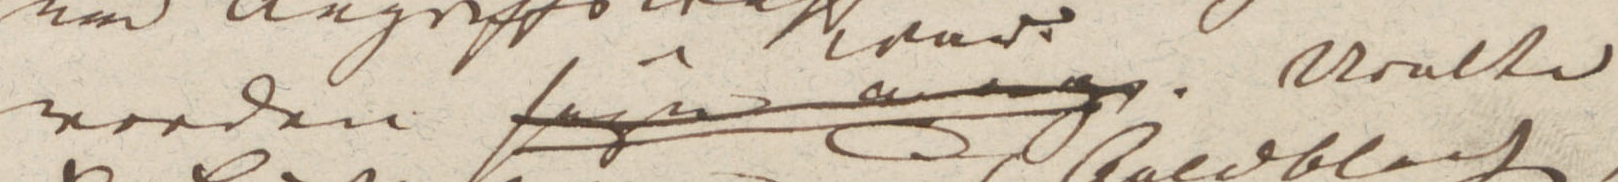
worden seyn mag. war. Uralte
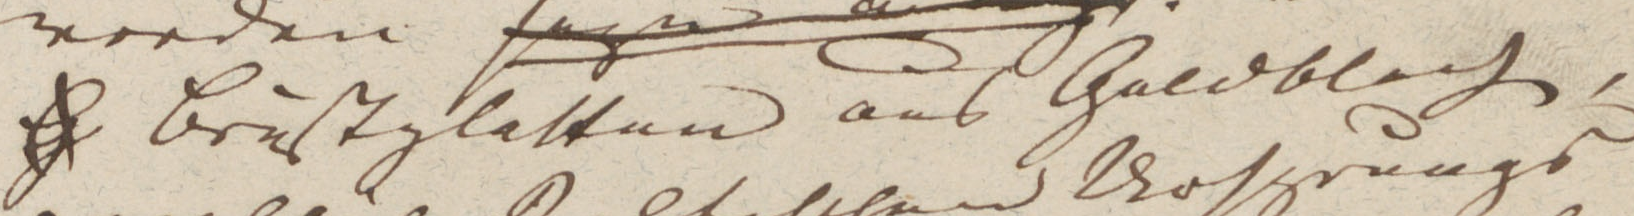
G Brustplatten aus Goldblech,
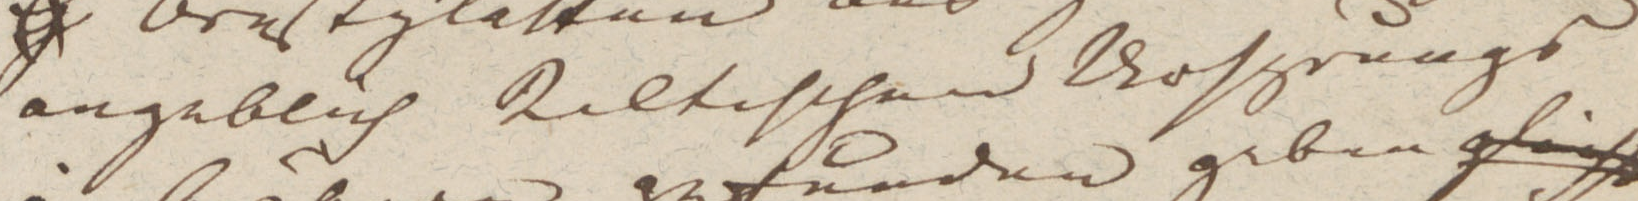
angeblich Keltischen Ursprungs
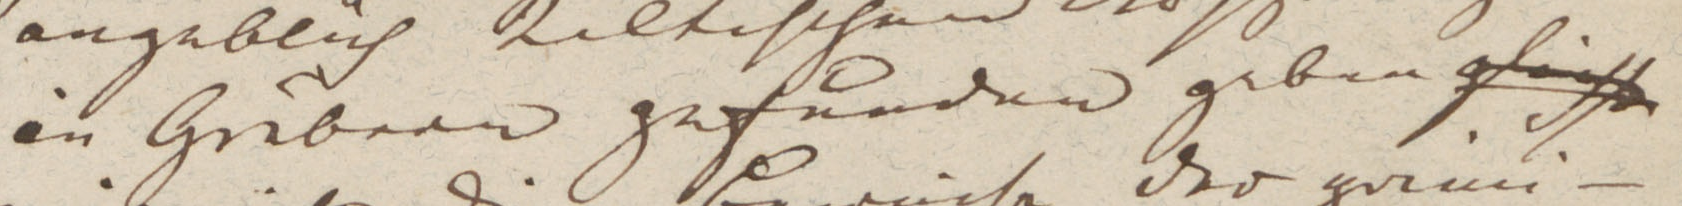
in Gräbern gefunden geben gleichs
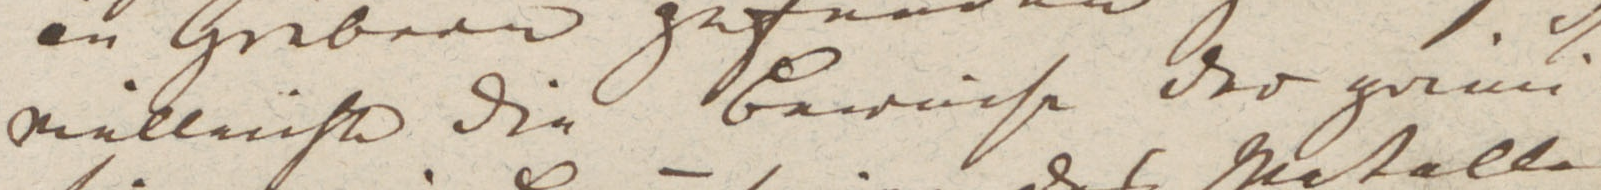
vielleicht die Beweise der primi-
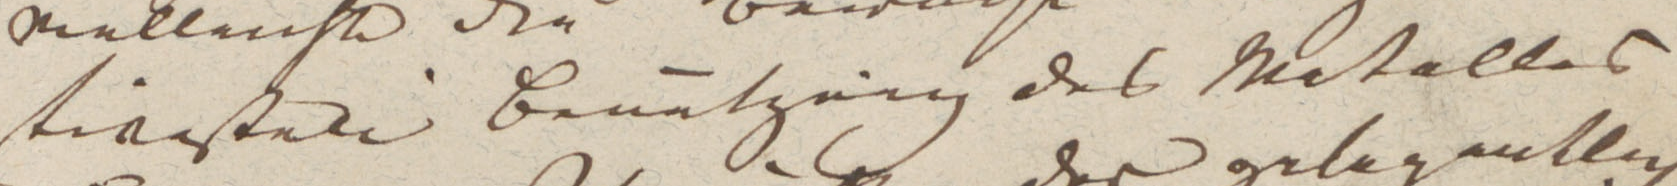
tivsten Benutzung des Metalles
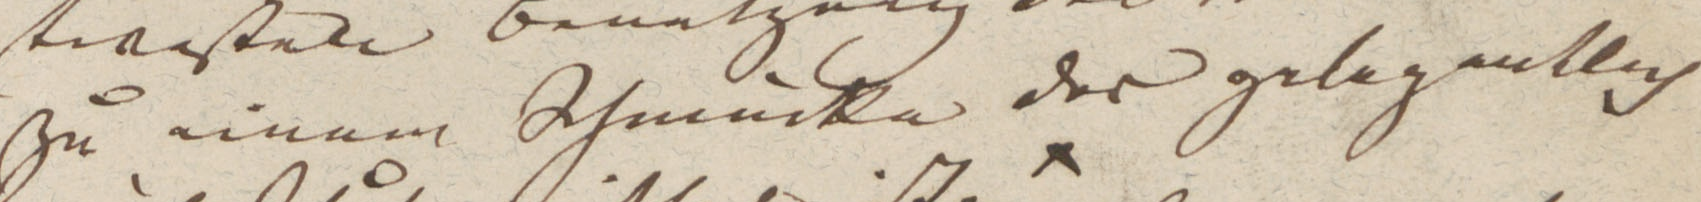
zu einem Schmucke der gelegentlich
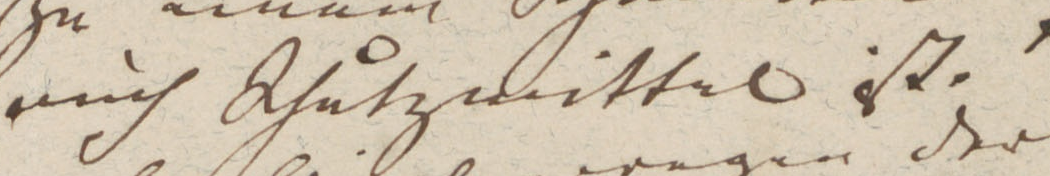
auch Schutzmittel ist. %
